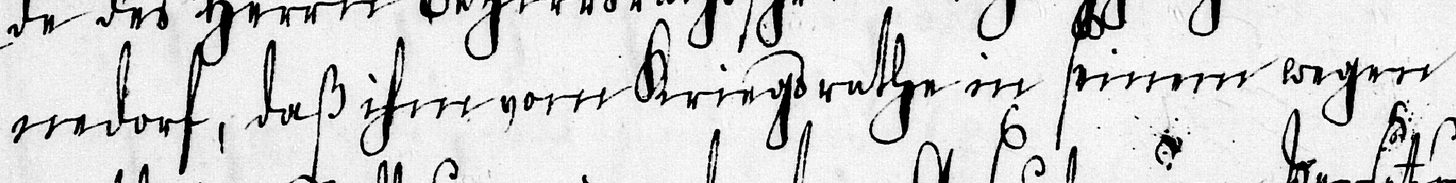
nnedorf, daß ihm vom Kriegsrathe in seinem wegen
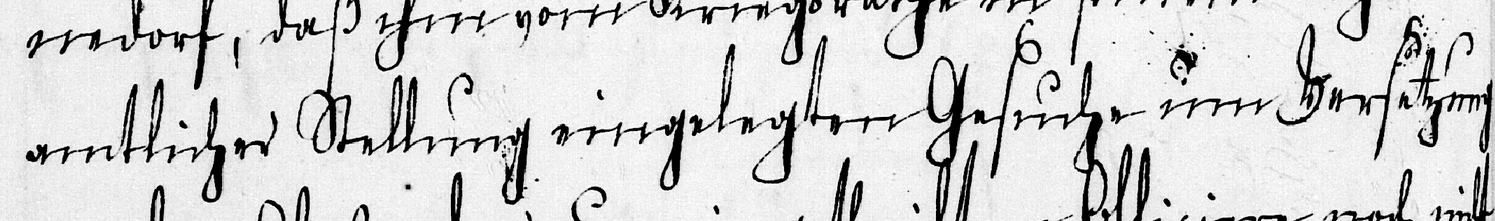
amtlicher Stellung eingelegten Gesuche um Versetzung
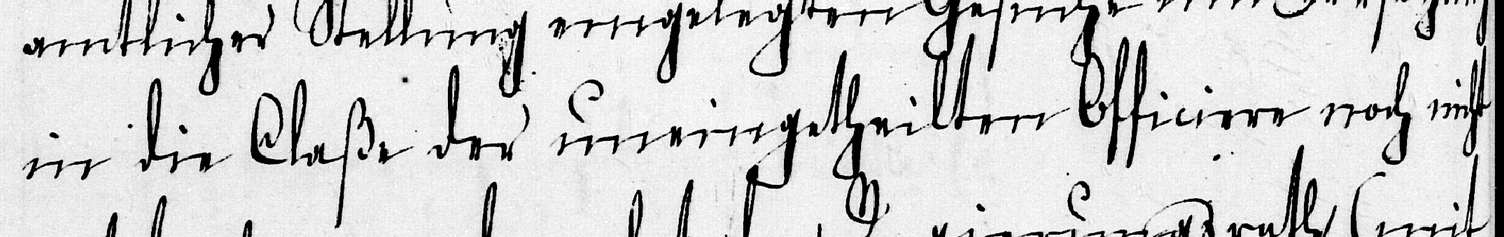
in die Claße der uneingetheilten Officiere noch nic¬
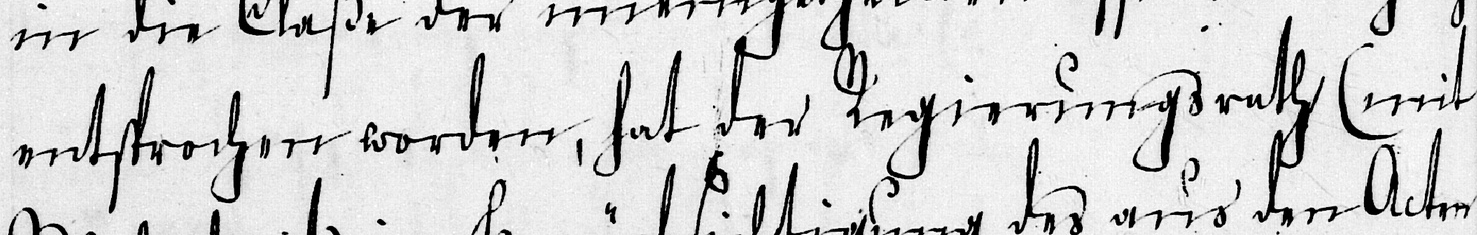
entsprochen worden, hat der Regierungsrath (mit
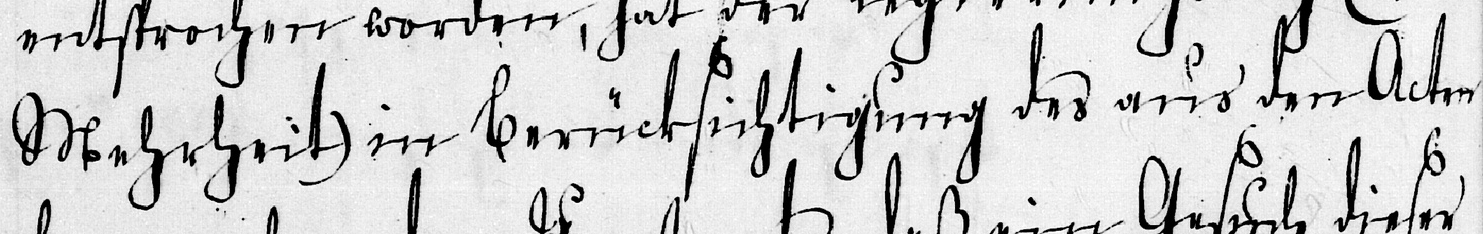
Mehrheit) in Berücksichtigung des aus den Acten
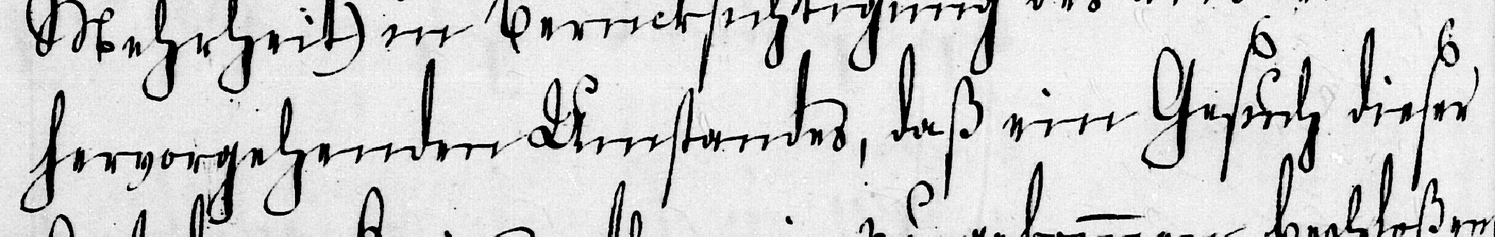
hervorgehenden Umstandes, daß ein Gesuch dieser
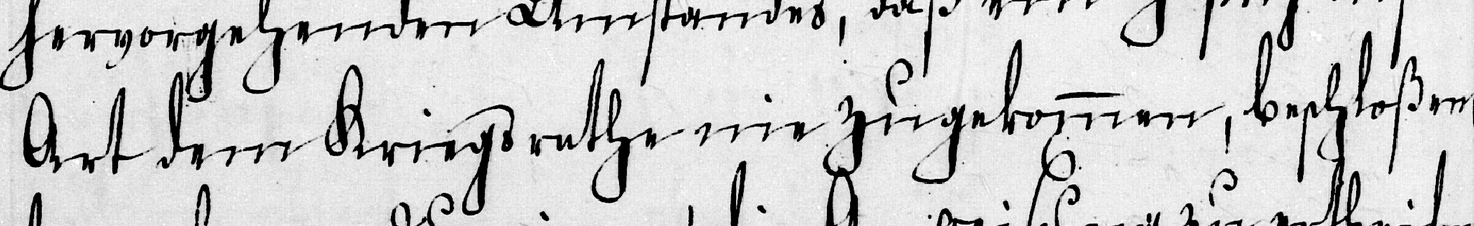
Art dem Kriegsrathe nie zugekommen, beschloßen
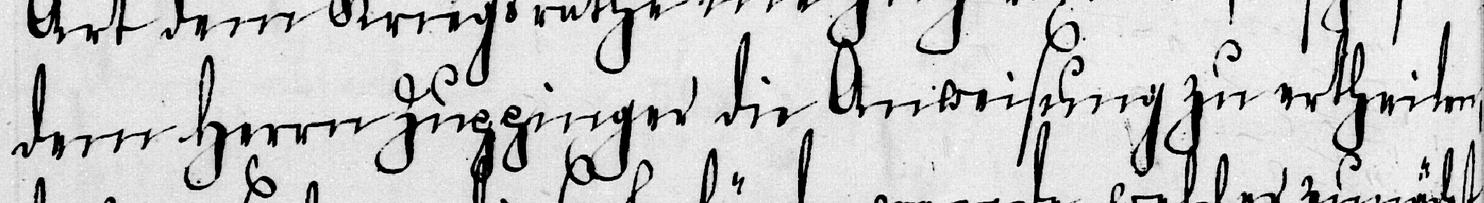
dem Herrn Zuppinger die Anweisung zu ertheilen,
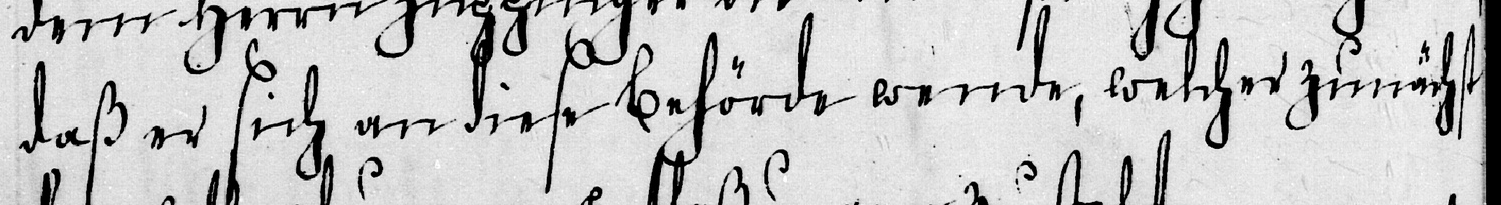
daß er sich an diese Behörde wende, welcher zunächst
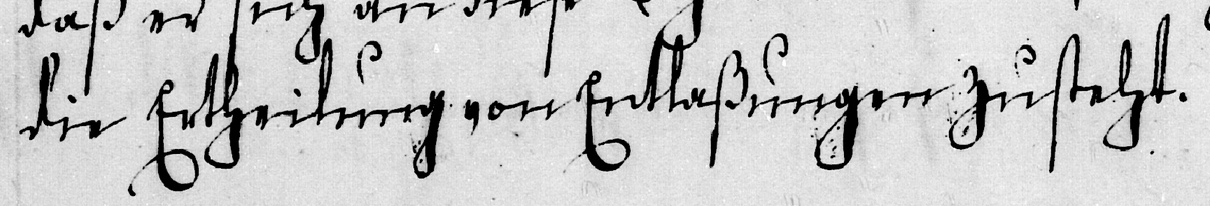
die Ertheilung von Entlaßungen zusteht.
